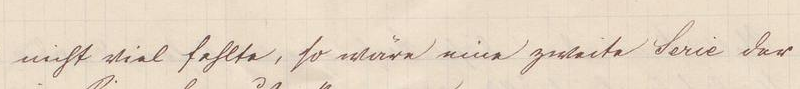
nicht viel fehlte, so wäre eine zweite Serie der
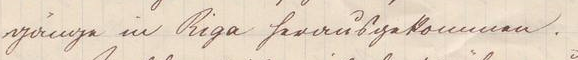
gänge in Riga herausgekommen.
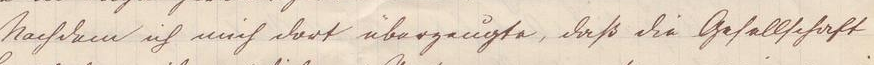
Nachdem ich mich dort überzeugte, daß die Gesellschaft
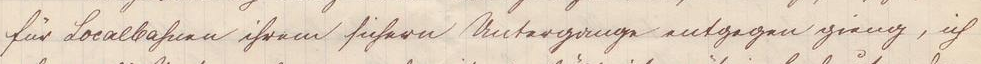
für Localbahnen ihrem sichern Untergange entgegen gieng, ich
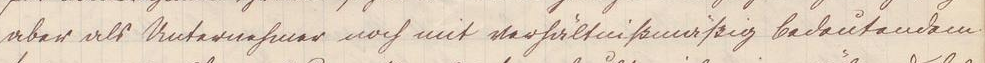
aber als Unternehmer noch mit verhältnißmäßig bedeutendem
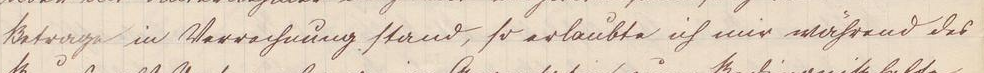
Betrage in Verrechnung stand, so erlaubte ich mir während des
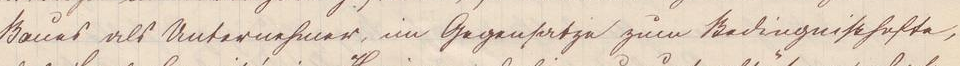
Baues als Unternehmer, im Gegensatze zum Bedingnißhefte
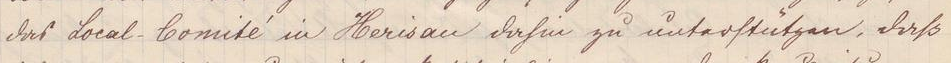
das Local-Comité in Herisau dahin zu unterstützen, daß
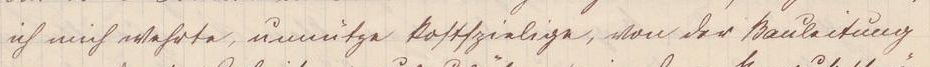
ich mich wehrte, unnütze kostspielige, von der Bauleitung
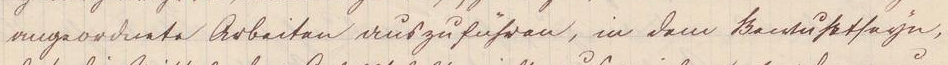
angeordnete Arbeiten auszuführen, in dem Bewußtseyn,
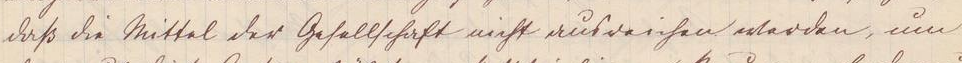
daß die Mittel der Gesellschaft nicht ausreichen werden, um
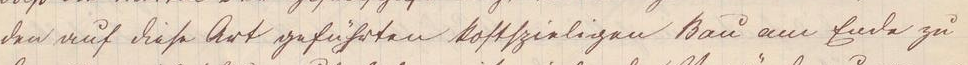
den auf diese Art geführten kostspieligen Bau am Ende zu
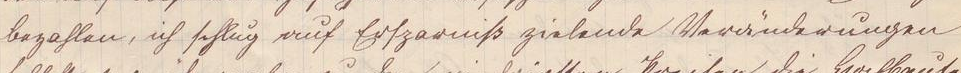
bezahlen, ich schlug auf Ersparniß zielende Veränderungen
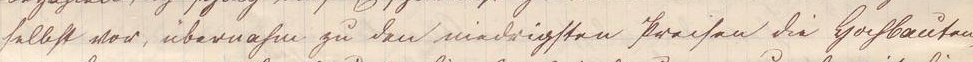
selbst vor, übernahm zu den niedrigsten Preisen die Hochbauten,
